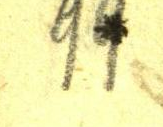99
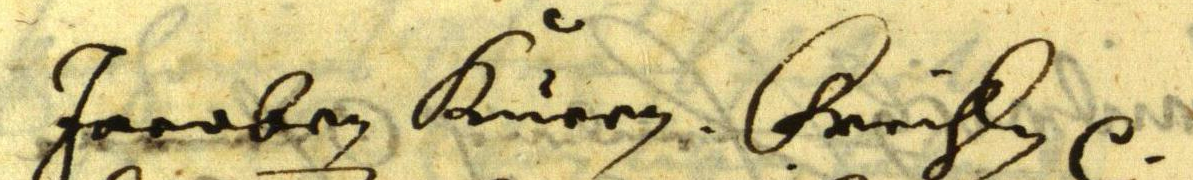Jacoben Kūeen. Freihn etc.
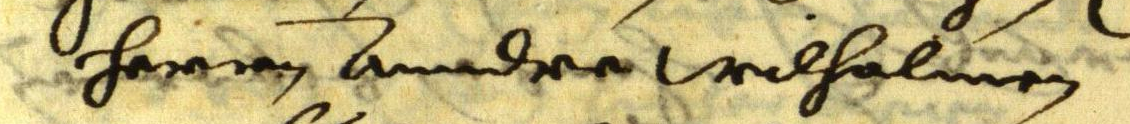herrn Anndre Wilhalmen
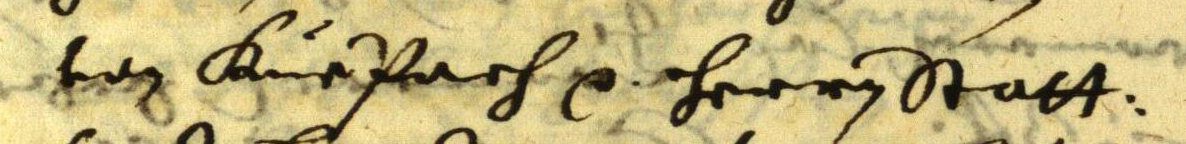von KūePach etc. herrn Statt¬
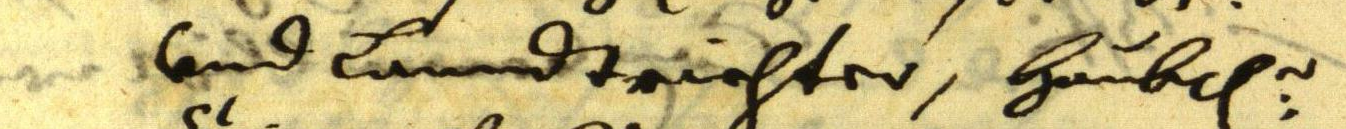vnd Lanndtrichter, Haūbt:
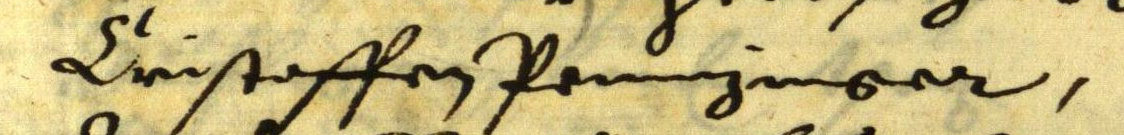Cristoffen Pennzinger,
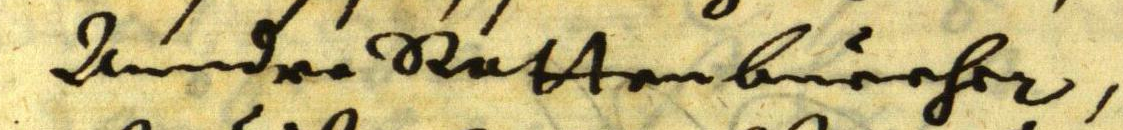Anndre Rottenbūecher,
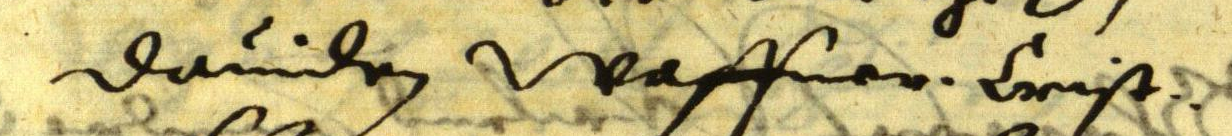Daūiden Waffner. Crist¬
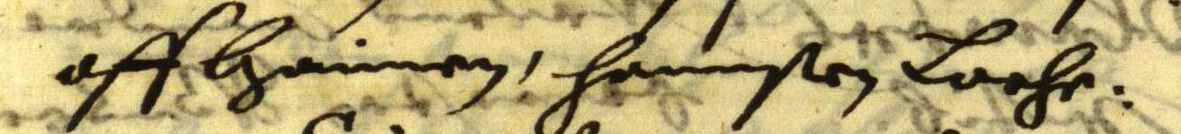off Haimen, hannsen Loche¬
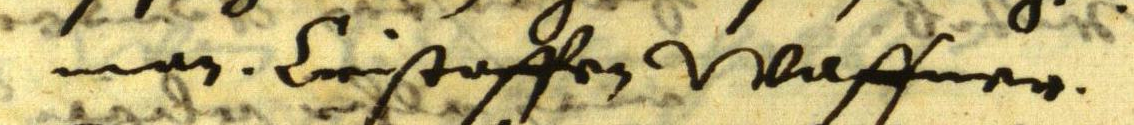man. Cristoffen Waffner.
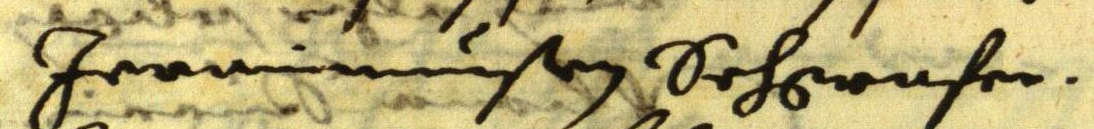Jeronimūsen Schgrafer.
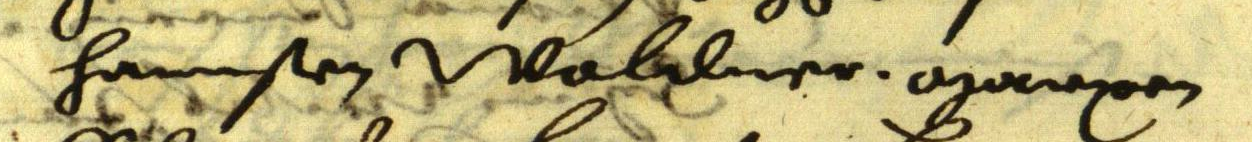hannsen Waldner. Marxen
